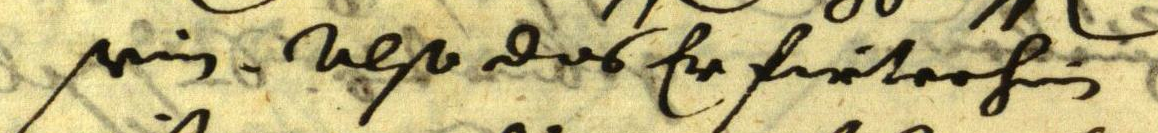sein. Also das Er firterhin
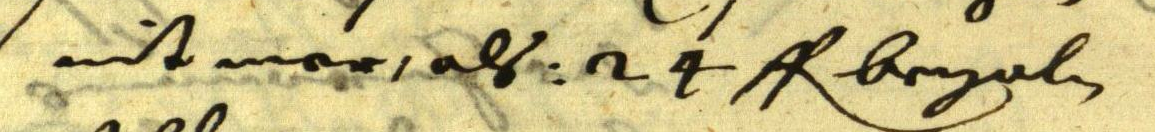nit mer, als: 24 fl bezaln
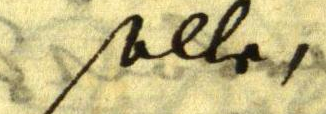solle,
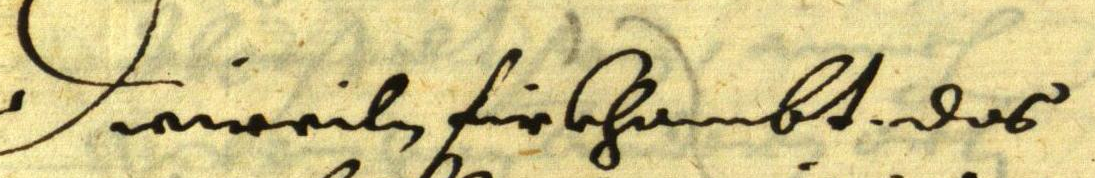Dieweiln firkhombt. das
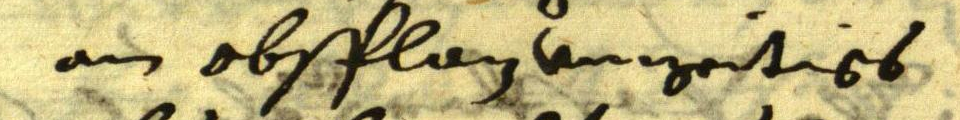an obsPlaz vnzeitigs
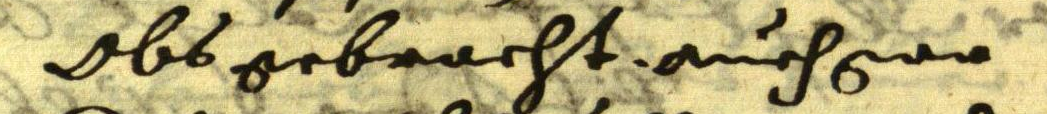Obs gebracht. aūch gar
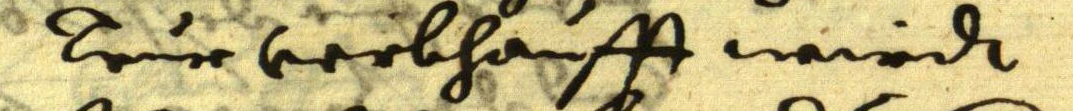Teūr verkhaūfft wirdt
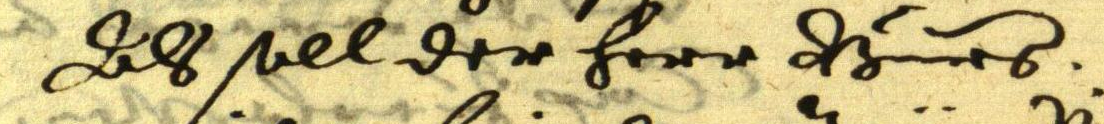Als soll der herr Būrg¬
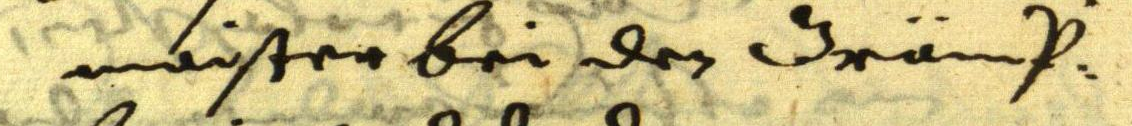maister bei den GrämP¬
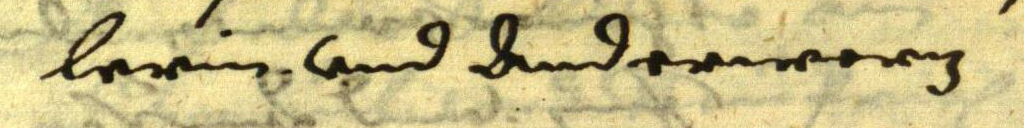lerin. vnd Anderwerz
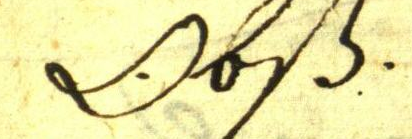Obß.
